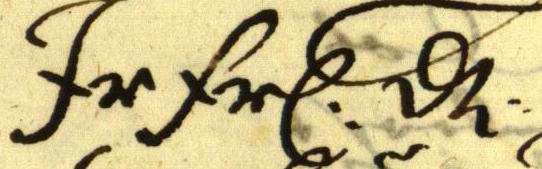Ir Frl: Dt:
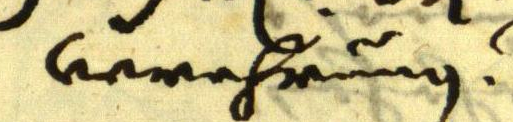verehrūng.
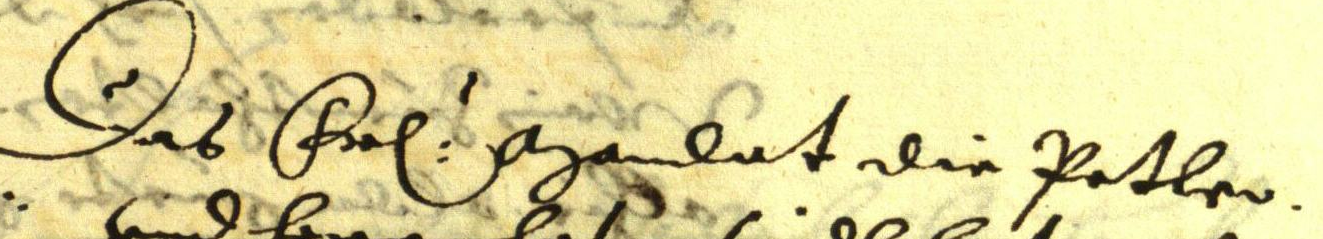Das Frl: Mandat die Petler.
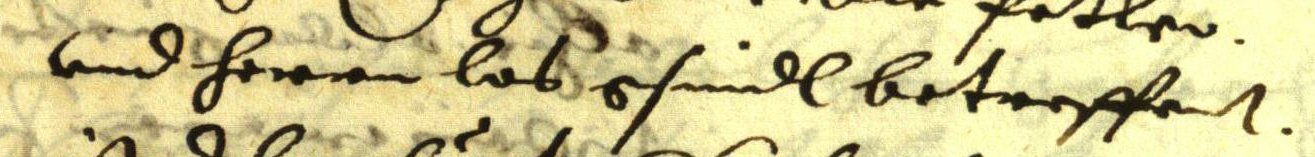vnd herrn los gsindl betreffent.
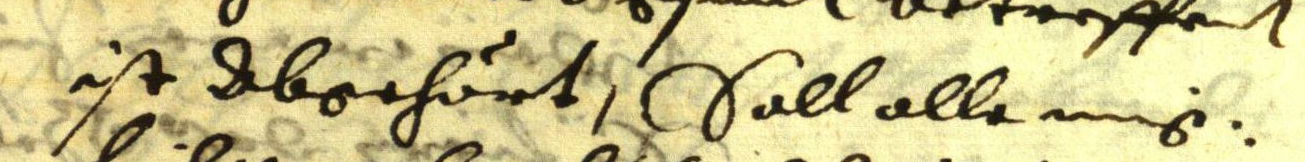ist Abgehōrt, Soll alle mig-
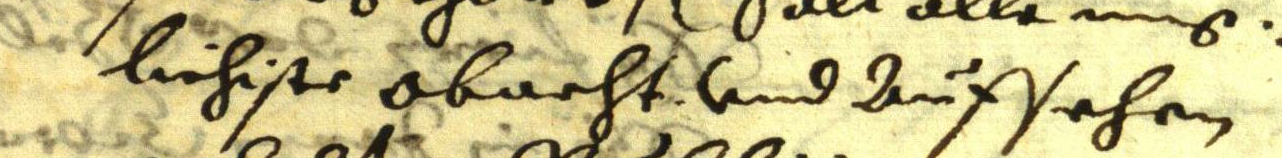lichiste Obacht. vnd Aūfsehen
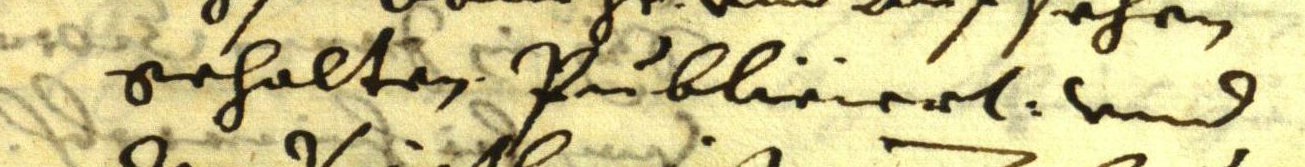gehalten. Pūbliciert: vnd
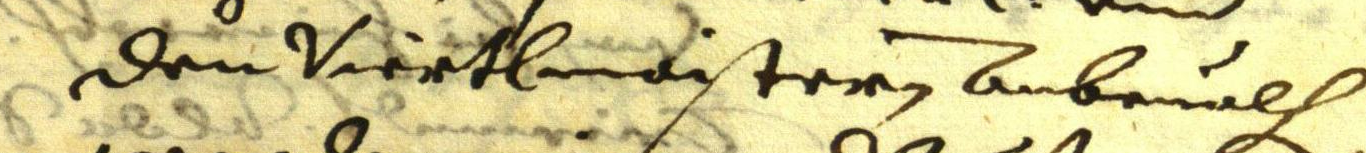den Viertlmaistern Anbeūolh
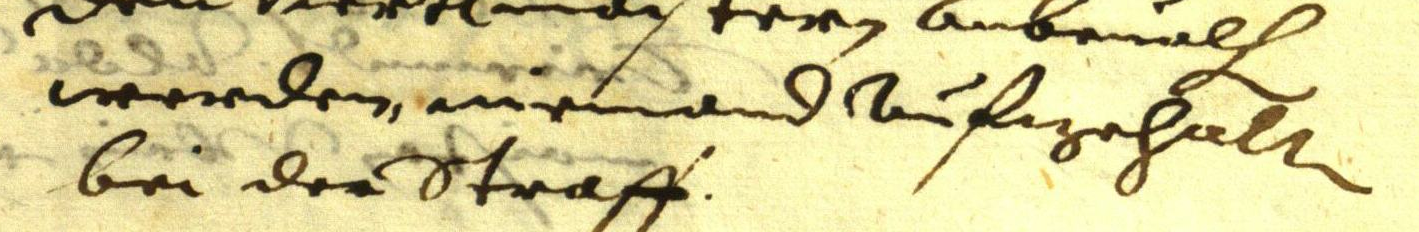werden, niemand Aūfzehalt
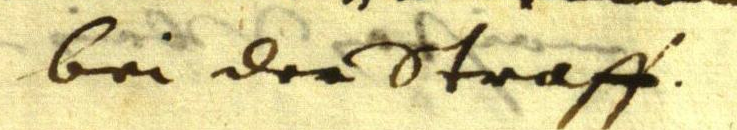bei der Straff.
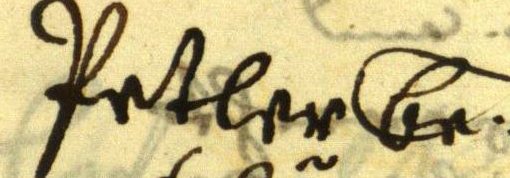Petler be¬
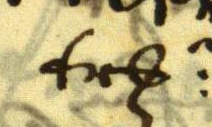tr:
